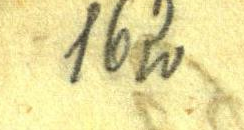162
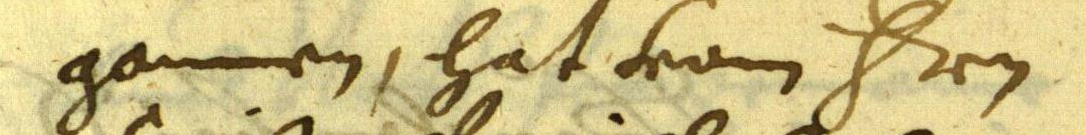gonnen, Hat vom hrn
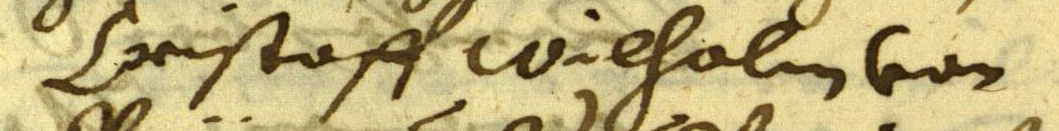Cristoff Wilhalm von
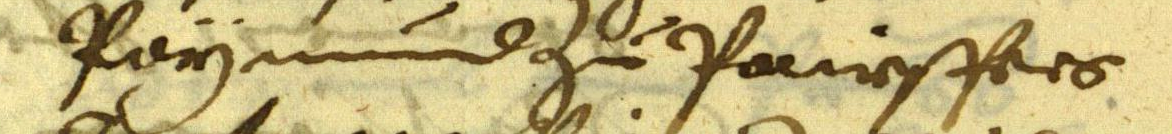Poÿmūnd Zū PairsPerg
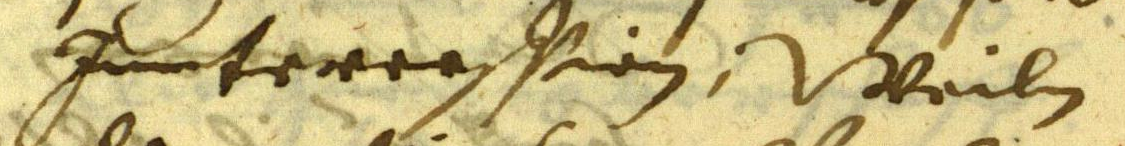Inntercession, Weiln
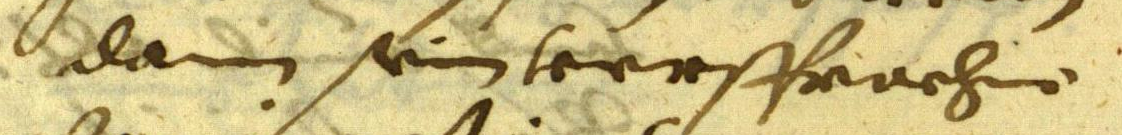dann sein versprochen
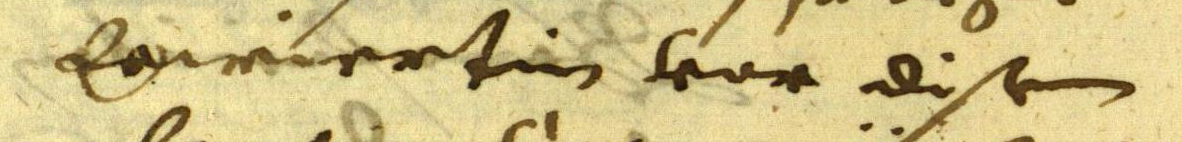Eewiertin vor disem
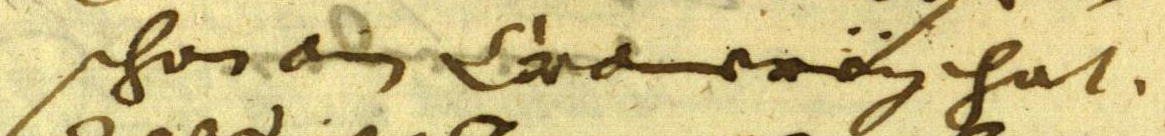schon ain Cramereÿ hat.
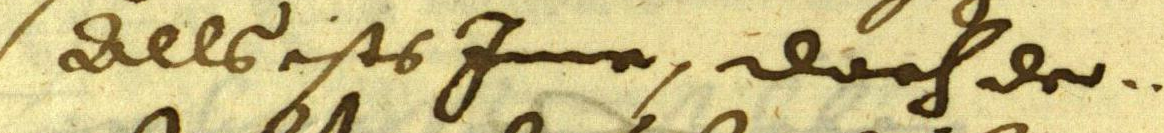Alls ists Ime doch der¬
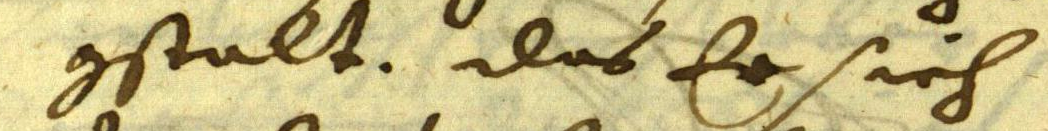gstalt. das Er sich
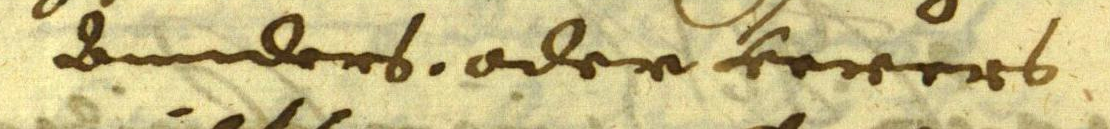Annders. oder verers
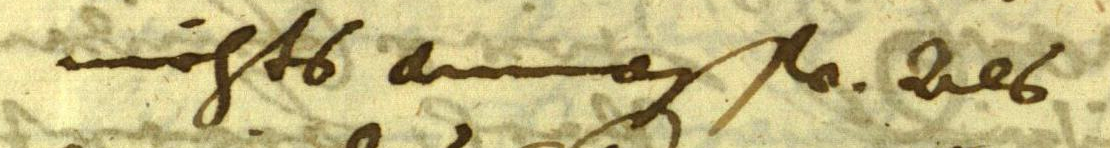nichts anmasse. Als
